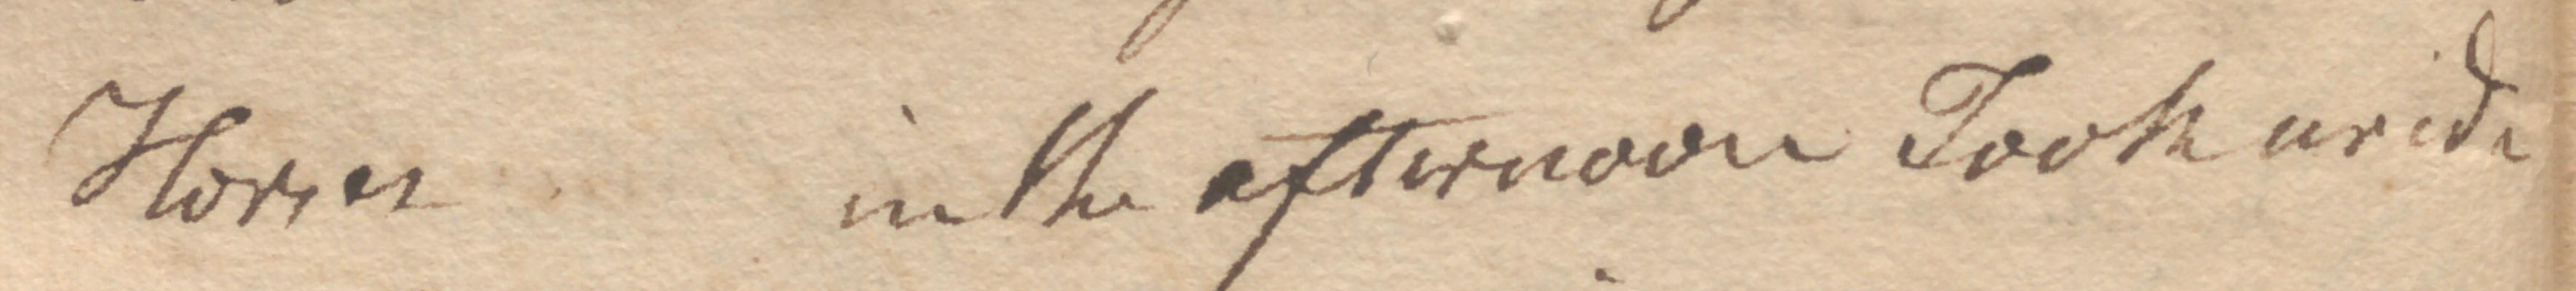Horses. in the afternoon Took a ride
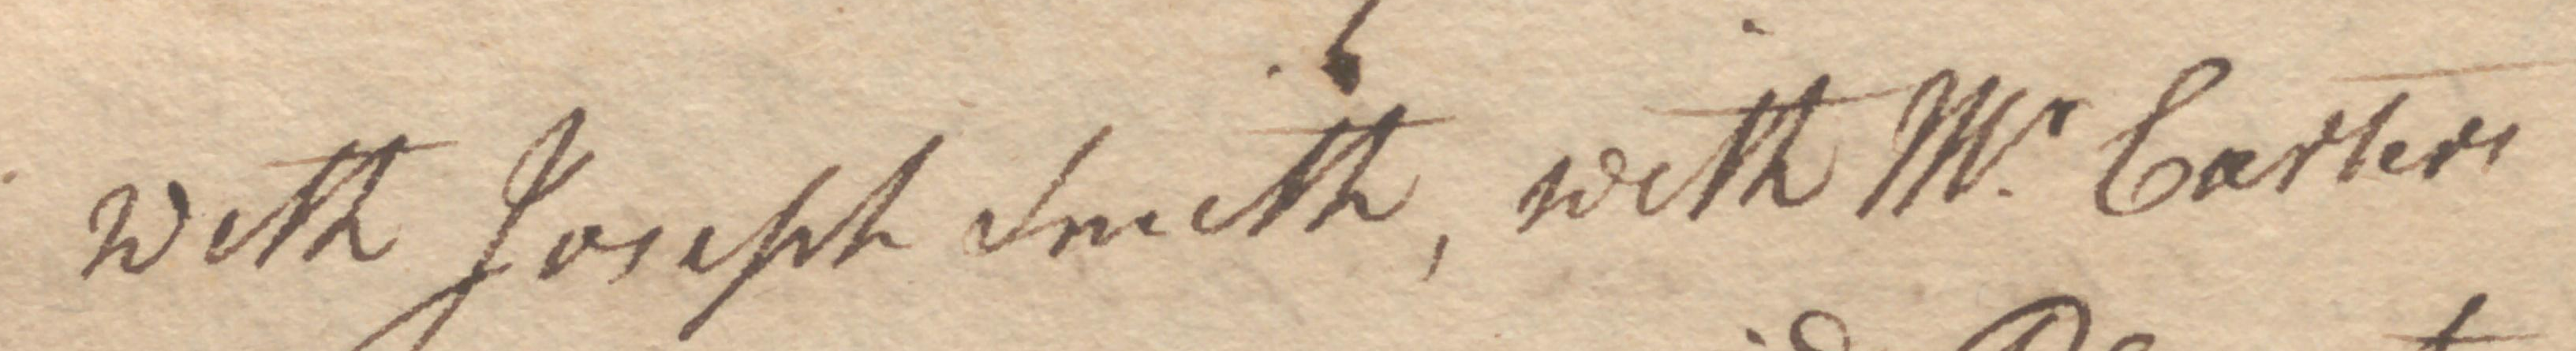with Joseph Smith, with M^r. Carters
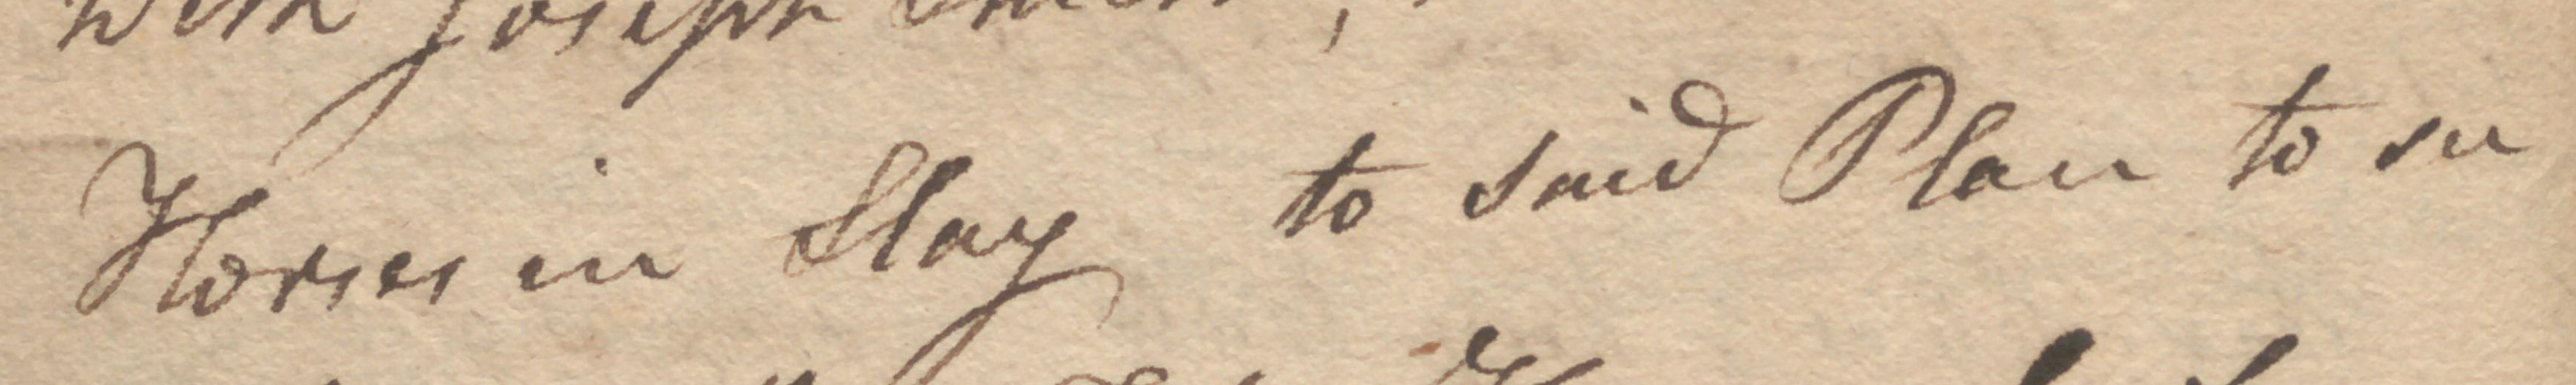Horses in Slay to said Place to see
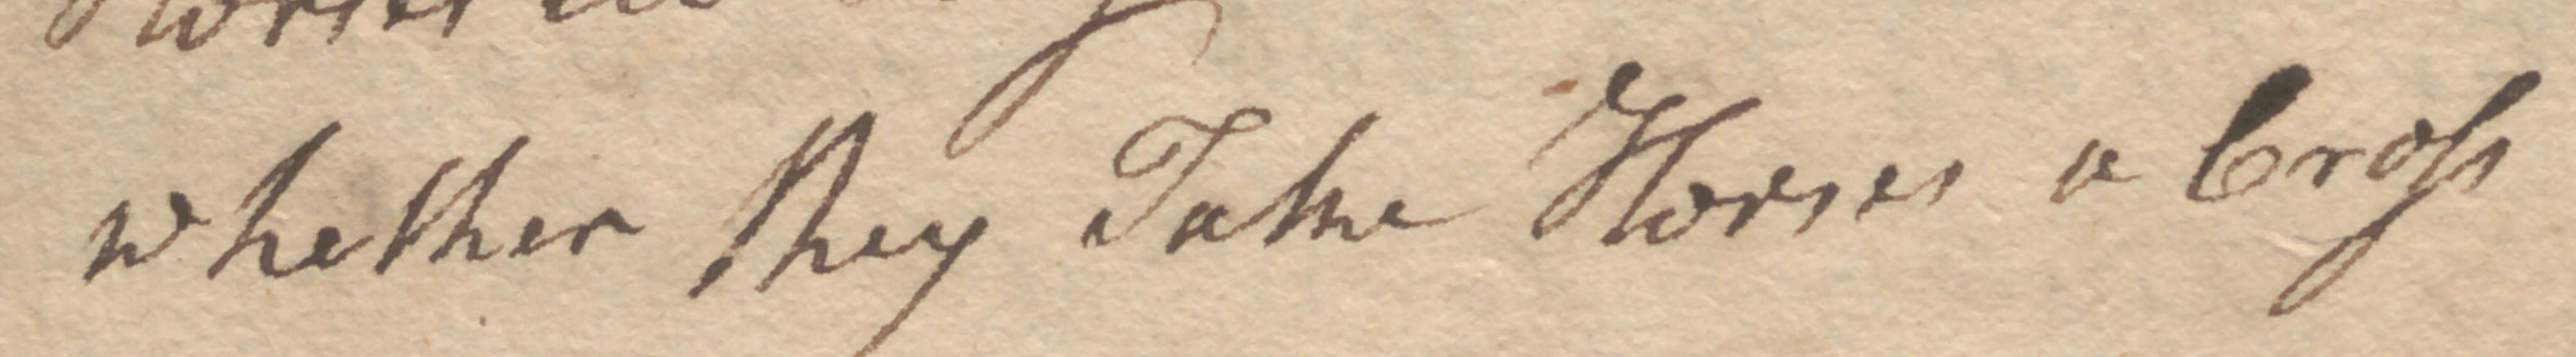whether they Take Horses a Cross
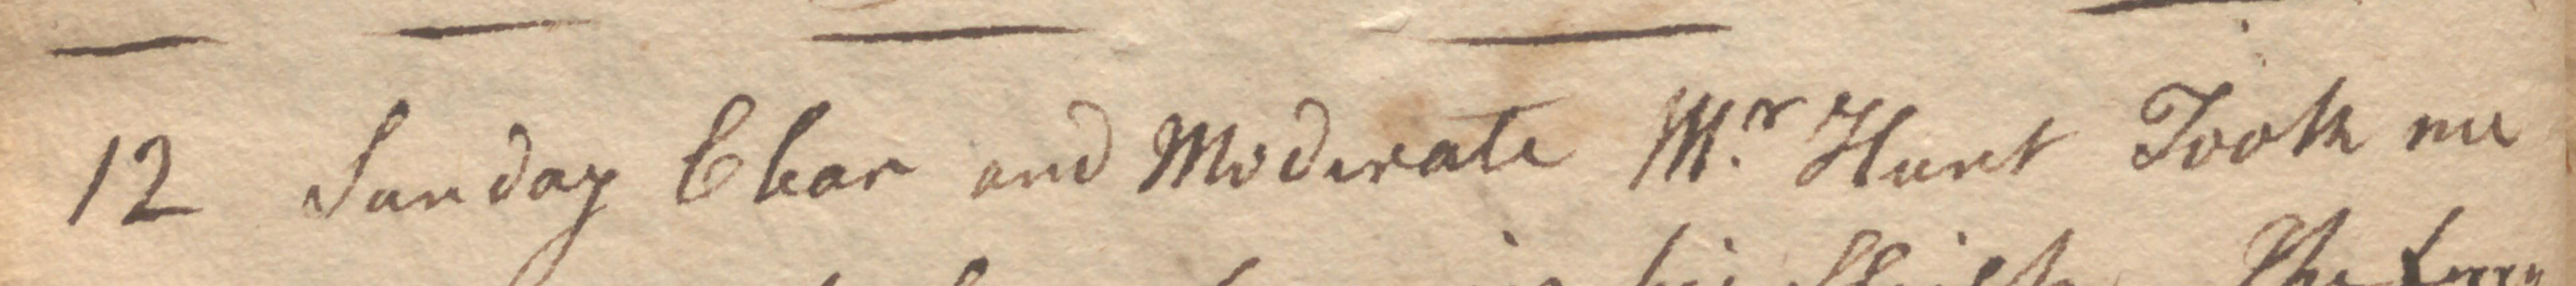12 Sunday Clear and Moderate M^r. Hunt Took me
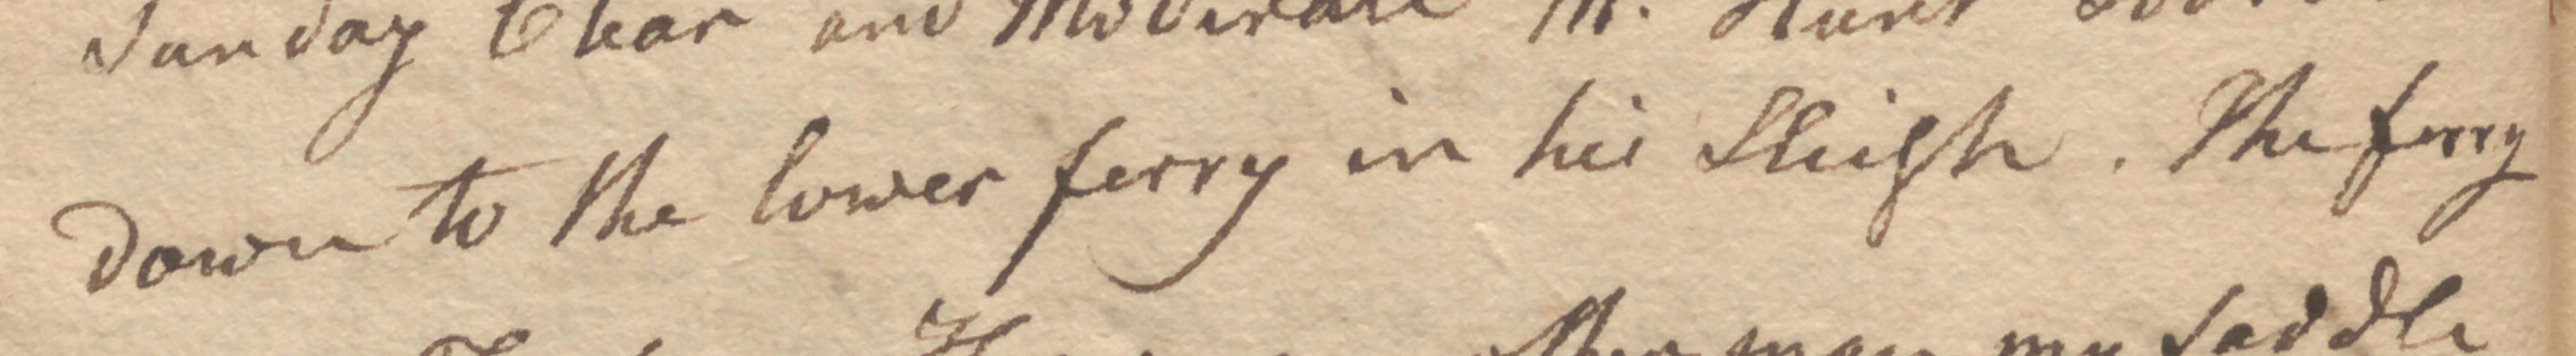down to the lower ferry in his Sleigh, the ferry
